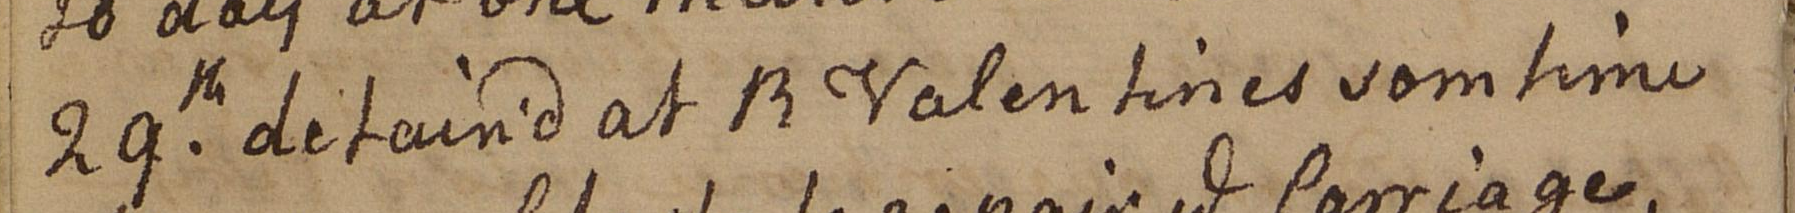2 9^th. detain'd at R Valentines som time
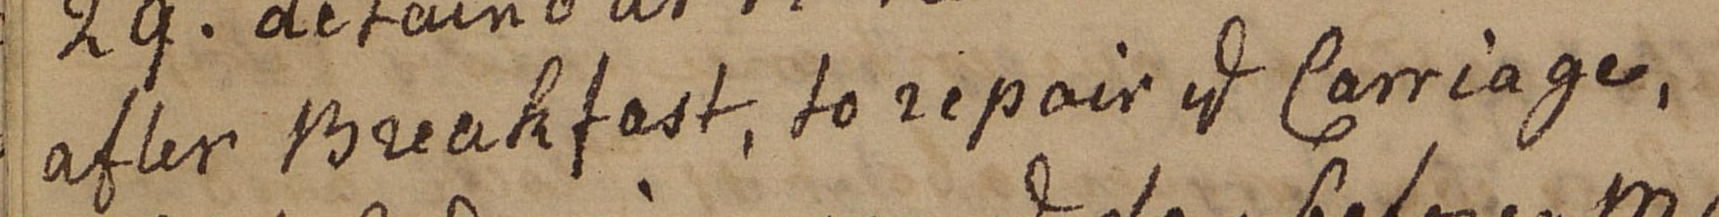after Breakfast, to repair y^e Carriage,
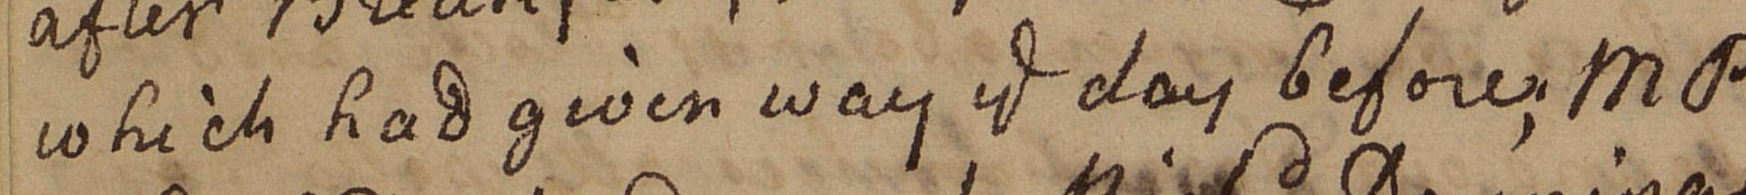which had given way y^e day before, MP
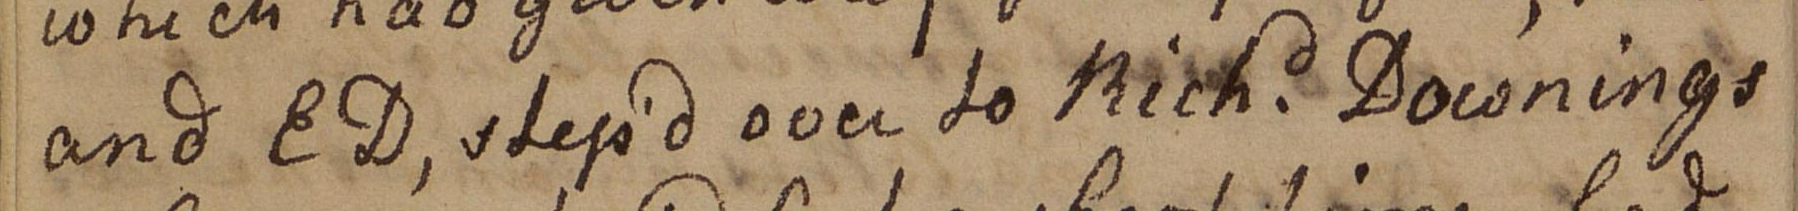and ED, step'd over to Rich^d Downings
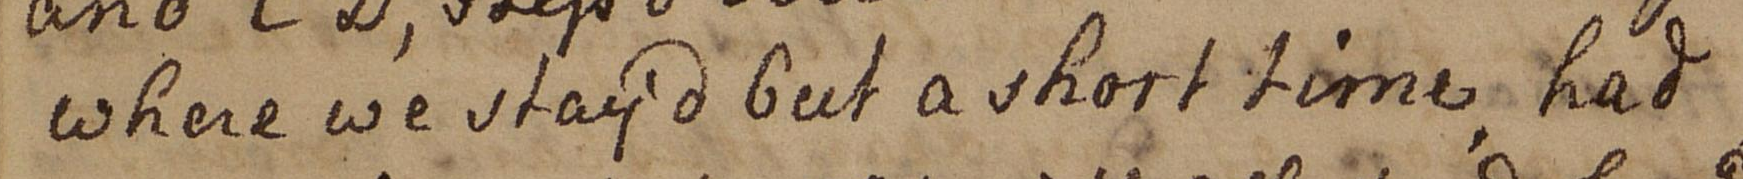where we stay'd but a short time, had
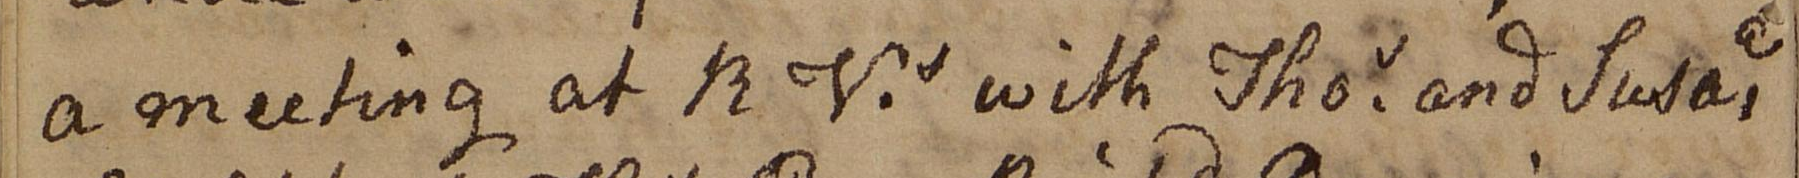a meeting at R V^s. with Tho^s. and Susa^a,
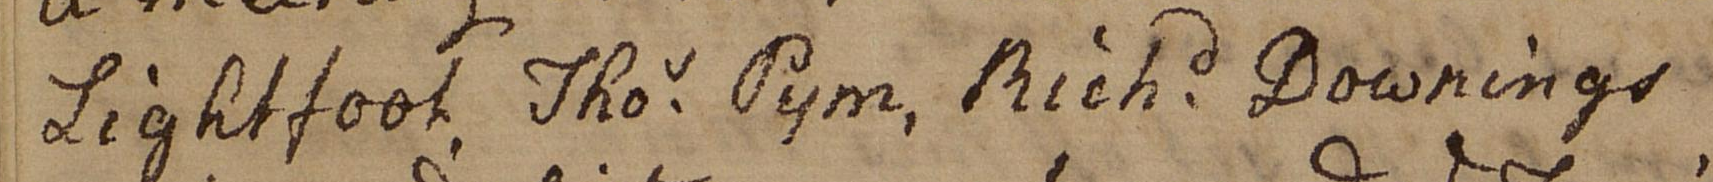Lightfoot, Tho^s. Pym, Rich^d. Downings
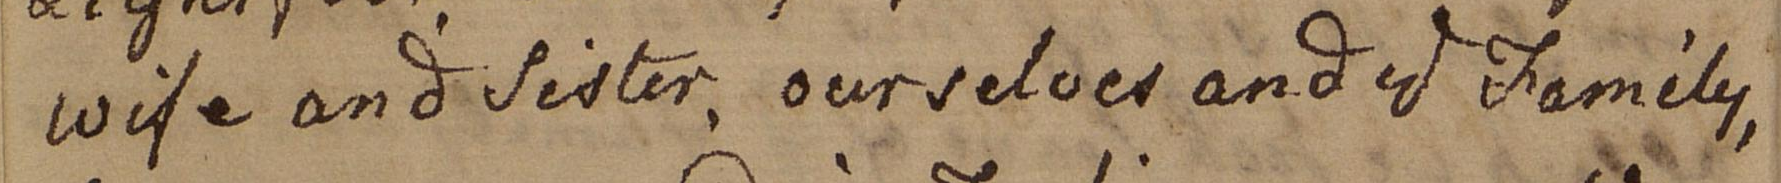wife and Sister, ourselves and y^e Family,
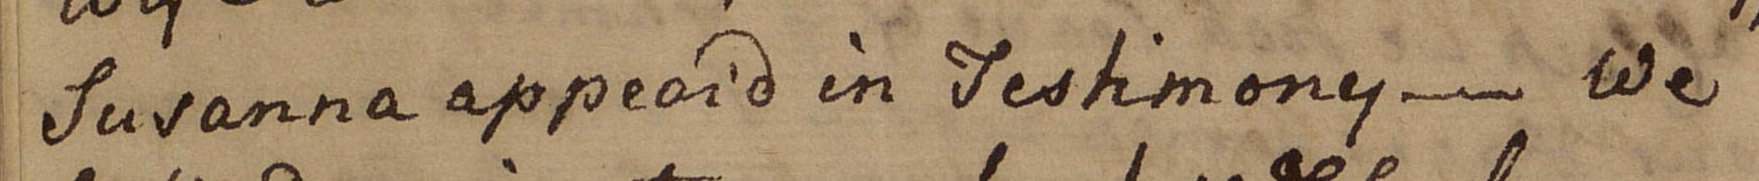Susanna appear'd in Testimony- We
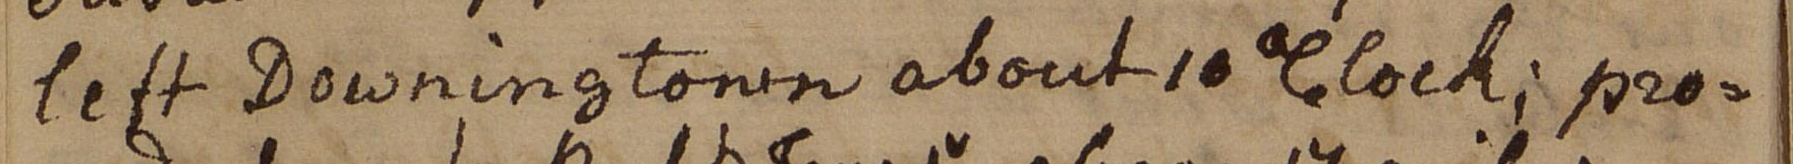left Downingtown about 10 ^o Clock; pro-
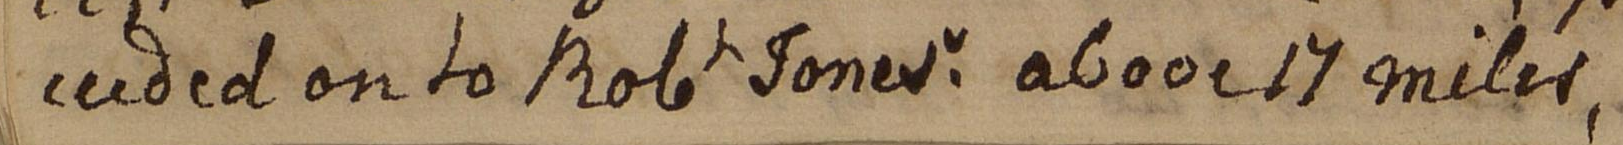ceeded on to Rob^t Jones^s. aboue 17 miles,
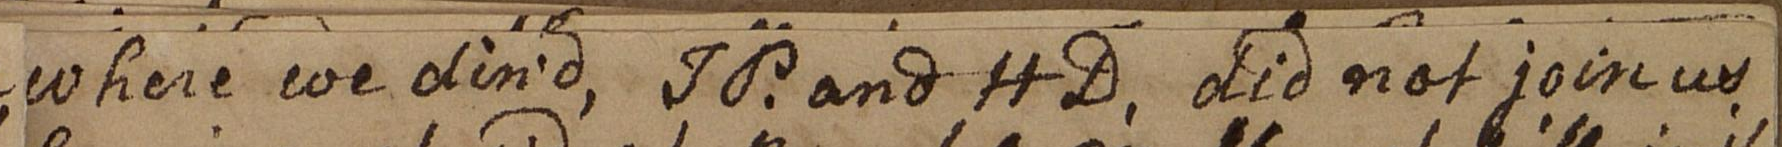where we din'd, J P. and H D, did not join us
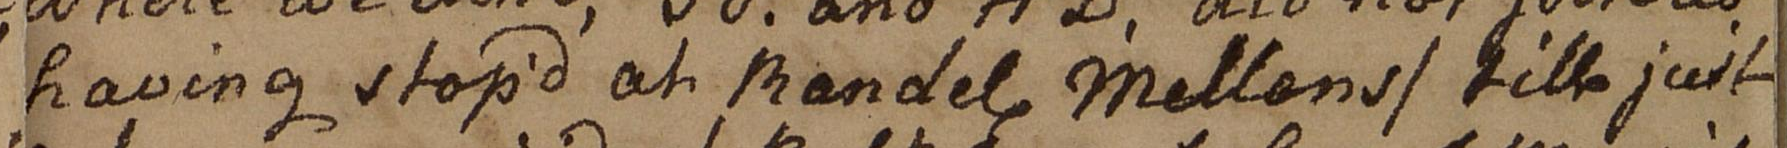having stop'd at Randel Mellons/ till just
